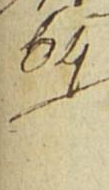64
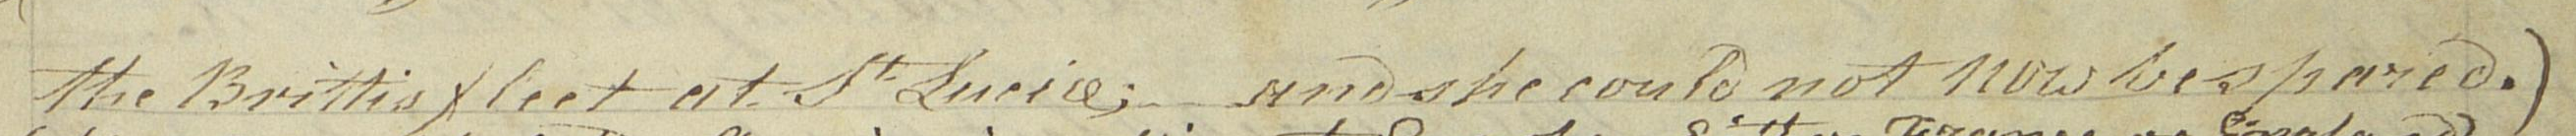the Brittish fleet at S^t Lucia; and she could not now be spared.)
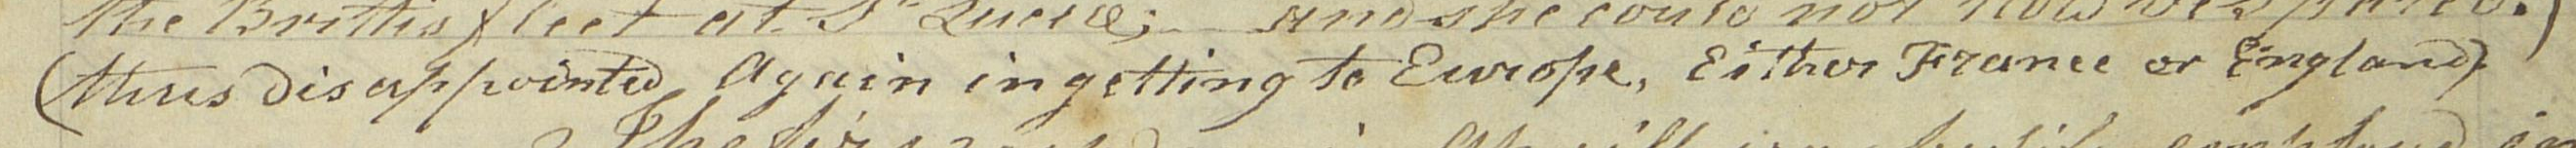(thus disappointed, Again in getting to Europe, Either France or England)
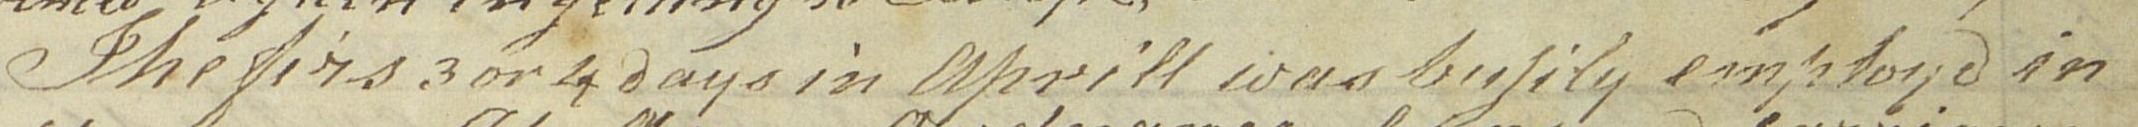The firs 3 or 4 days in Aprill was busily employd in
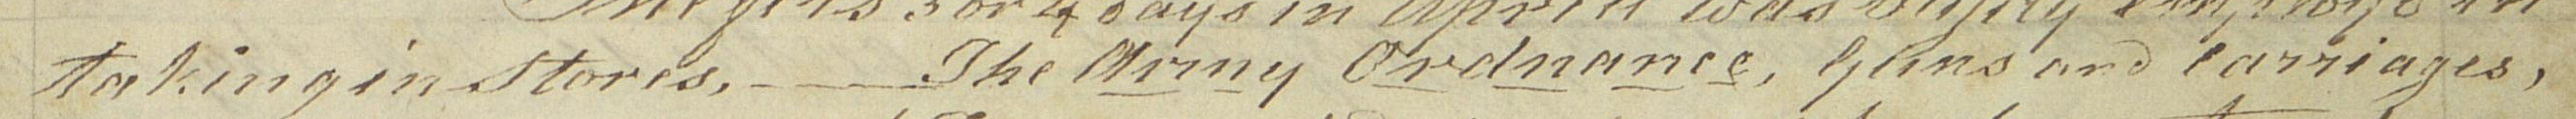taking in stores, The Army Ordnance, Guns and Carriages,
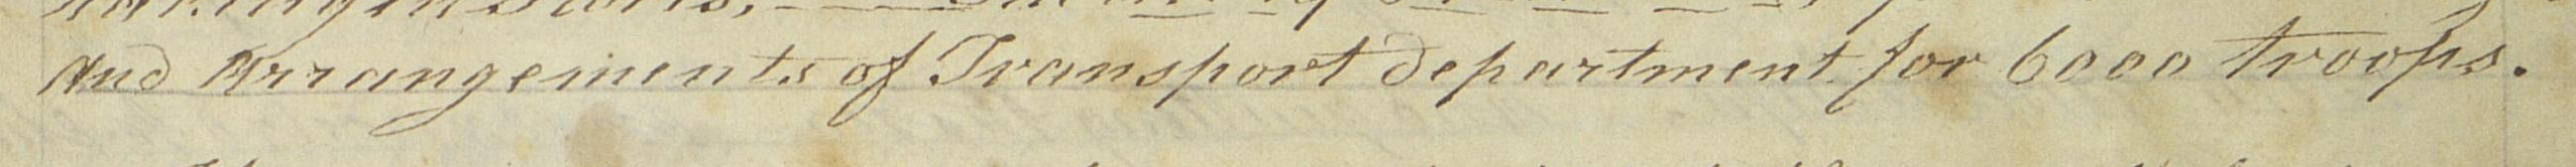and arrangements of Transport department for 6000 troops.
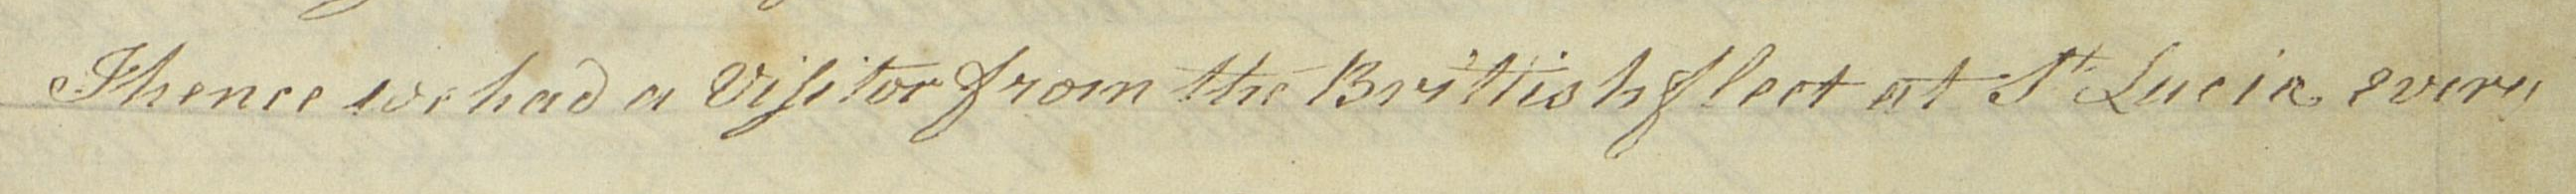Thence we had a visitor from the Brittish fleet at S^t Lucia every
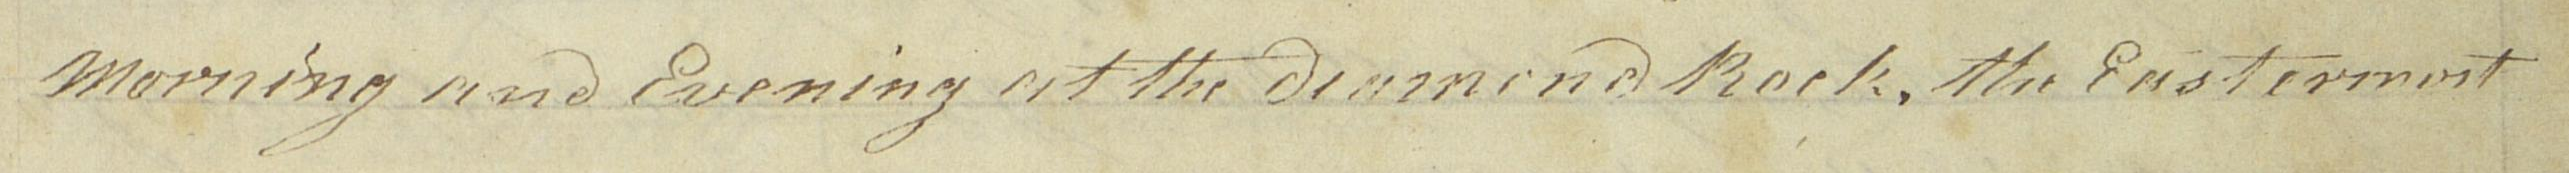Morning and Evening at the diamond Rock, the Eastermost
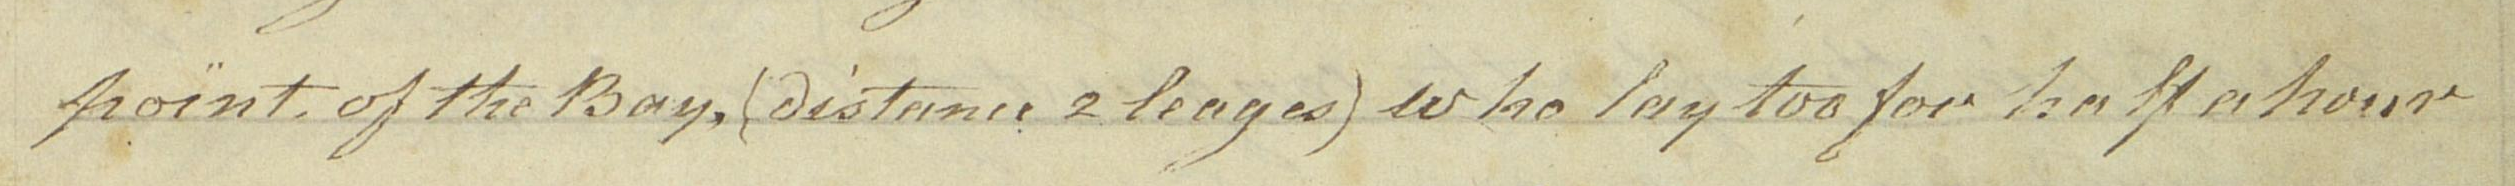point of the Bay, (distance 2 leages) who lay too for half a hour
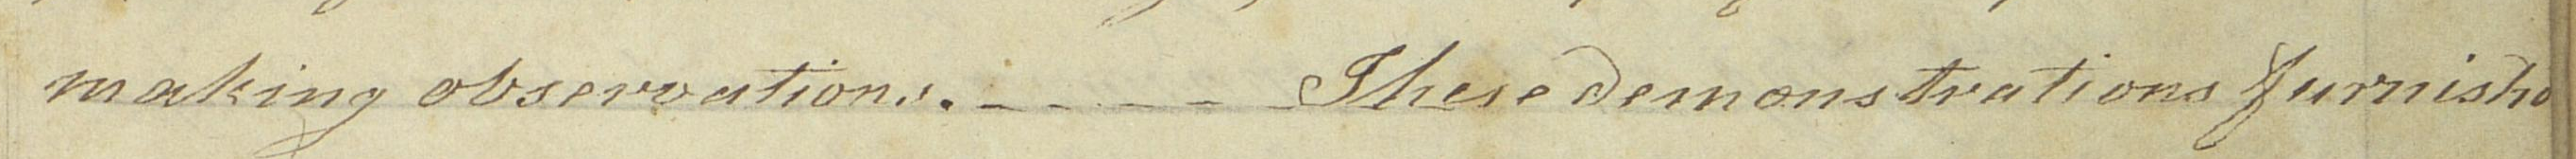making observations. These demonstrations furnishd
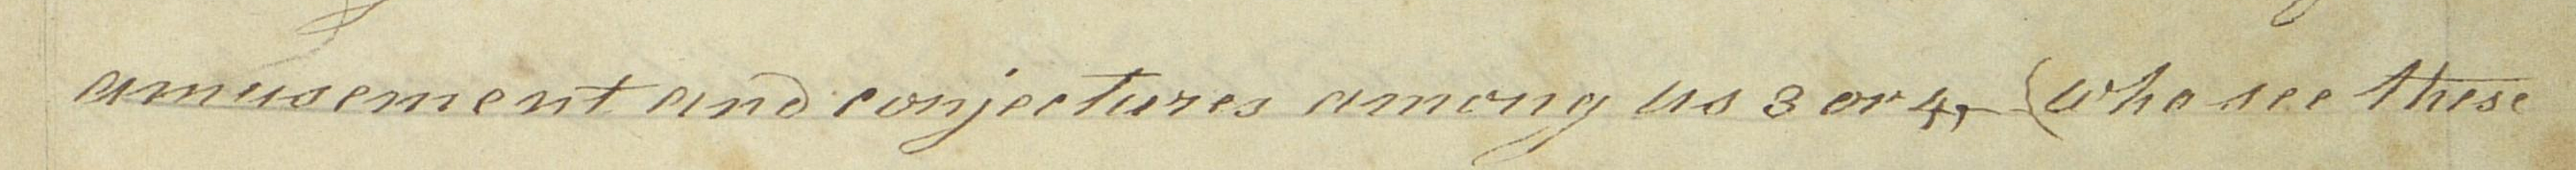amusement and conjectures among us 3 or 4, (who see these
